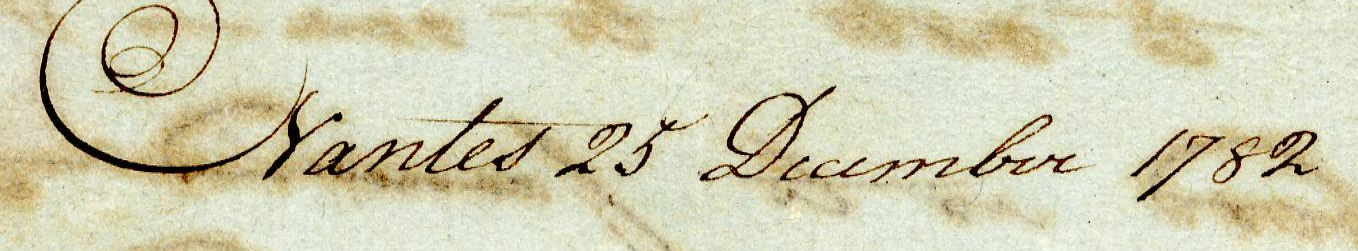Nantes 25 December 1782
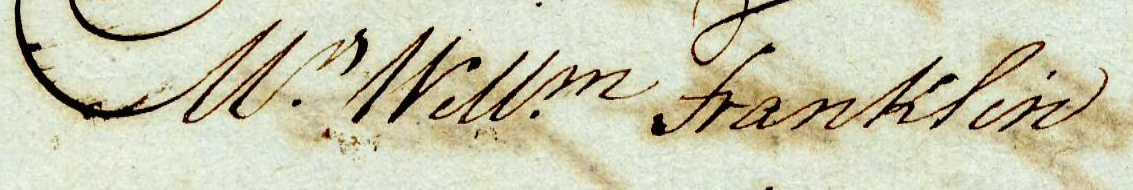M^r. Will^m. Franklin
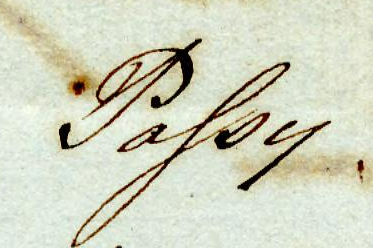Passy
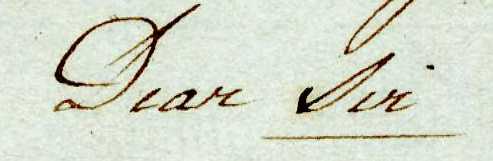Dear sir
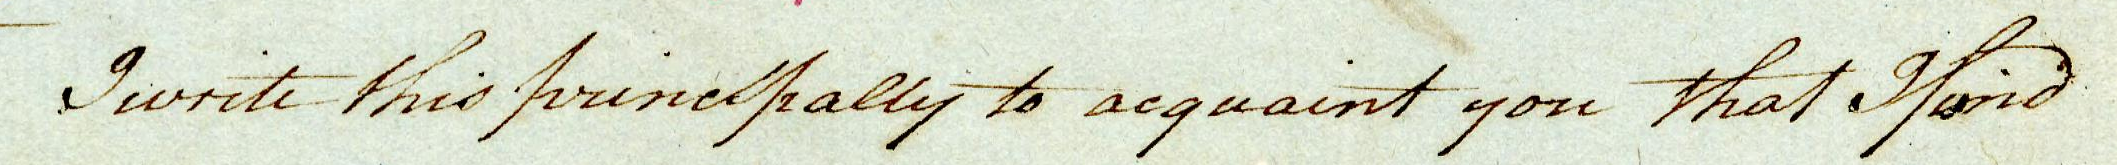I write this principally to acquaint you that I find
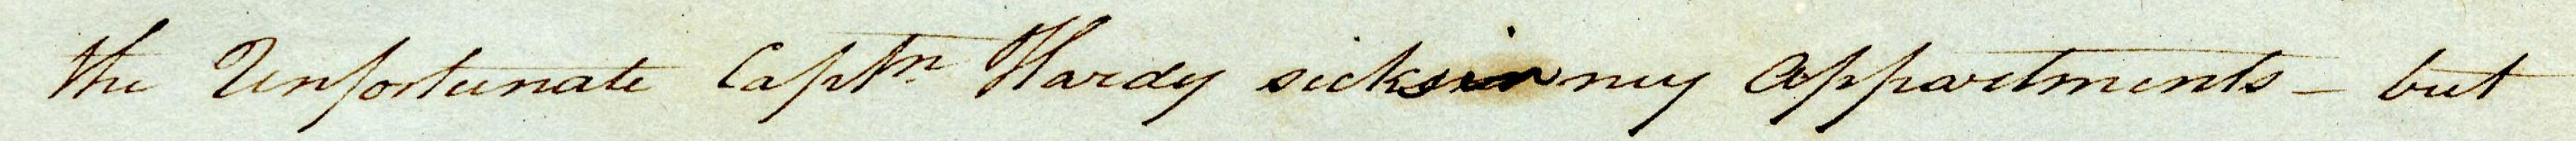the Unfortunate Capt^n. Hardy sick in my Appartments- but
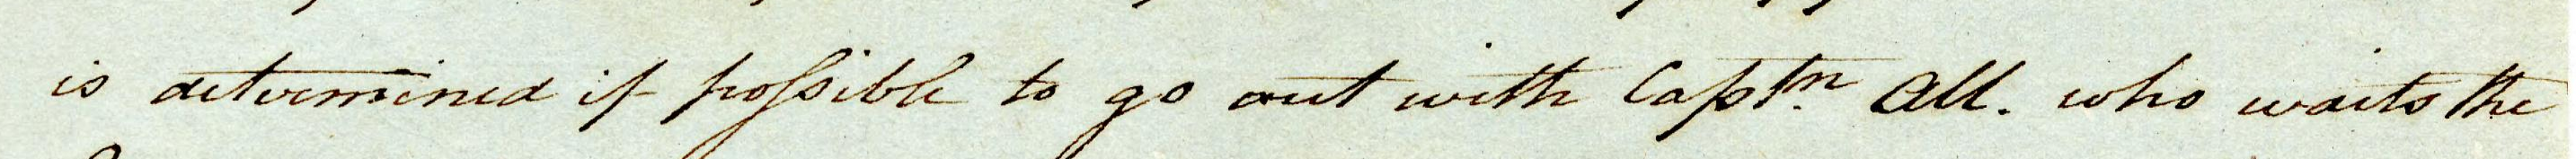is determined if possible to go out with Capt^n. All who waits the
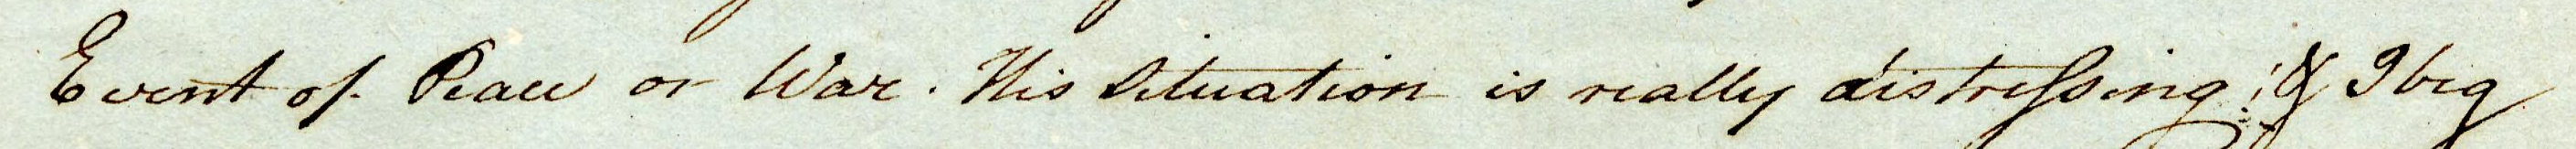Event of Peace or War. His Situation is really distressing; & I beg
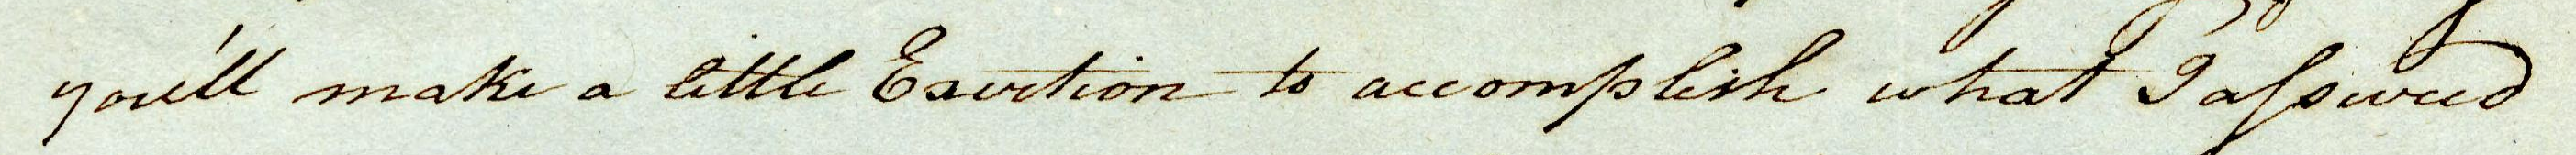you'll make a little Exertion to accomplish what I assured him
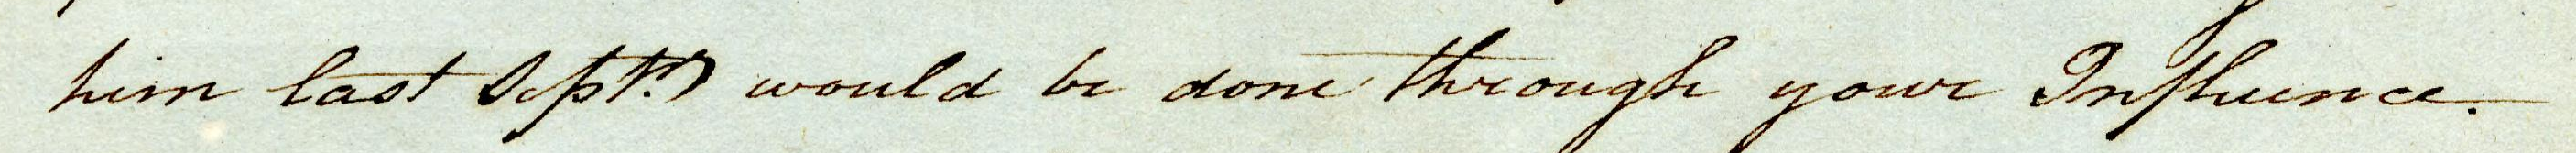him last Sept^r. would be done through your Influence.
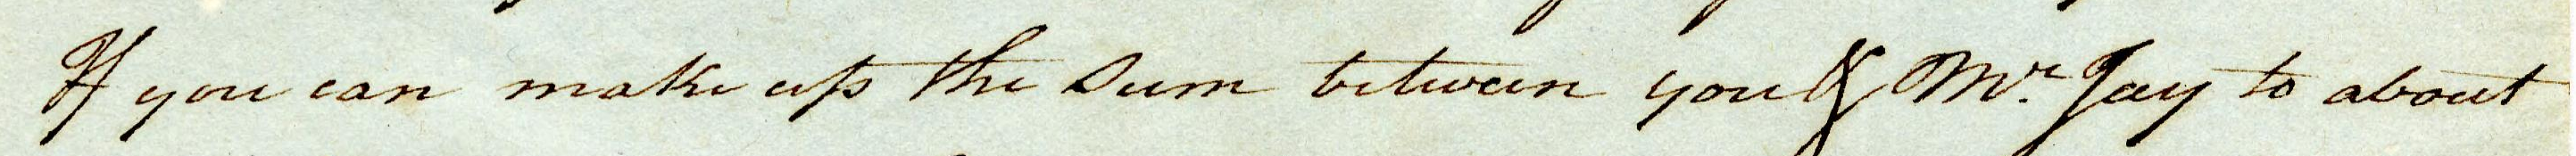If you can make up the sum between you & M^r. Jay to about
